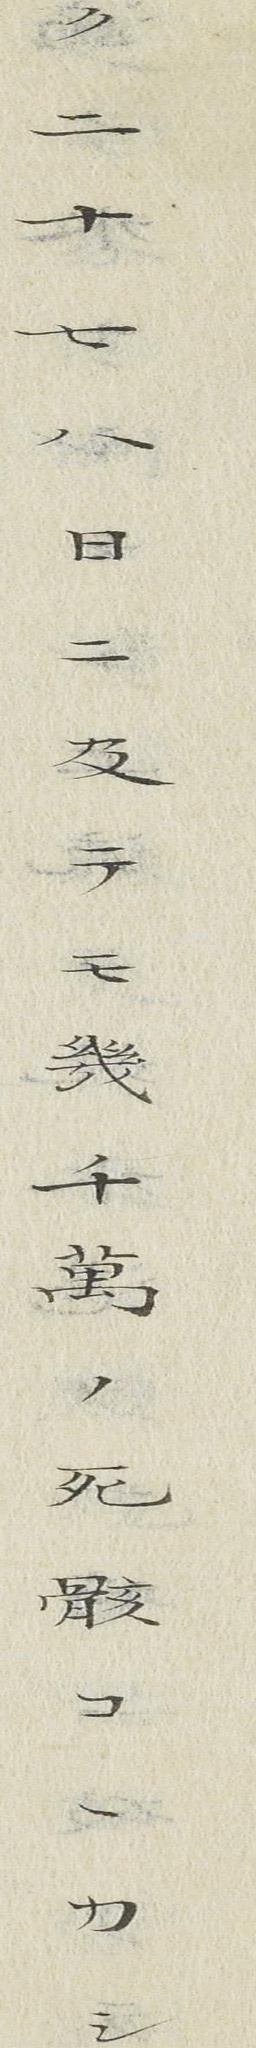クニ十七八日ニ及テモ幾千万ノ死骸コヽカシ
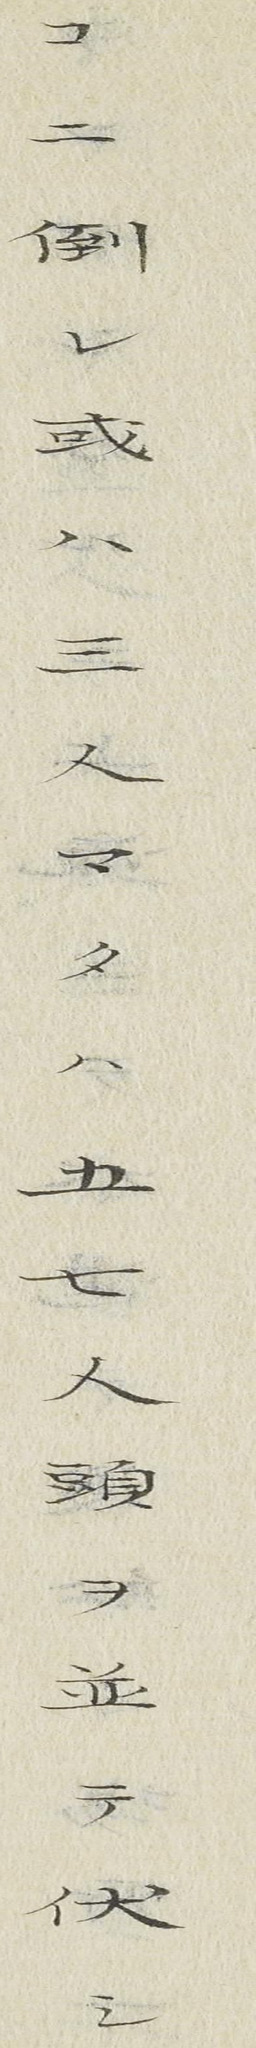コニ倒レ或ハ三人マタハ五七人頭ヲ並テ伏シ
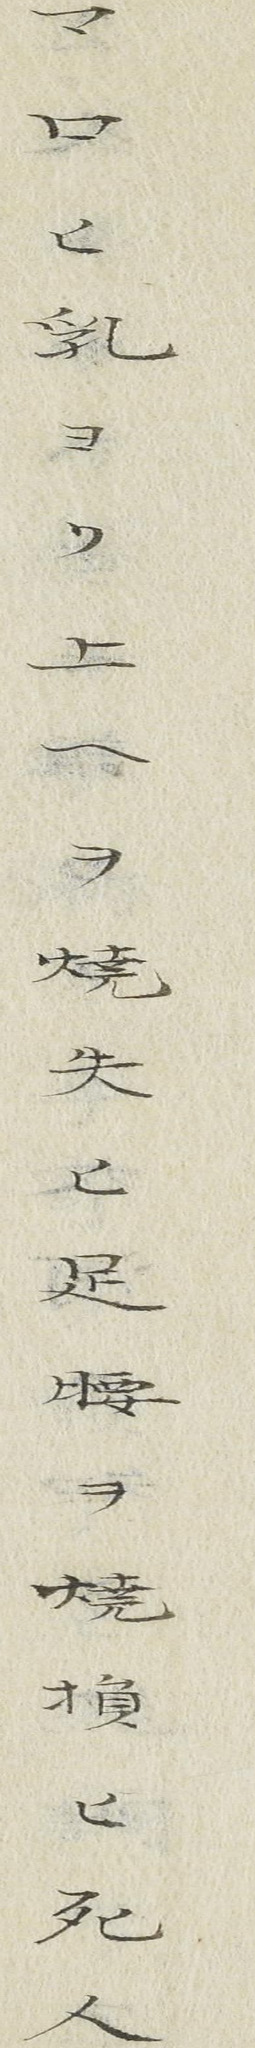マロヒ乳ヨリ上ヘヲ焼失ヒ足腰ヲ焼損ヒ死人
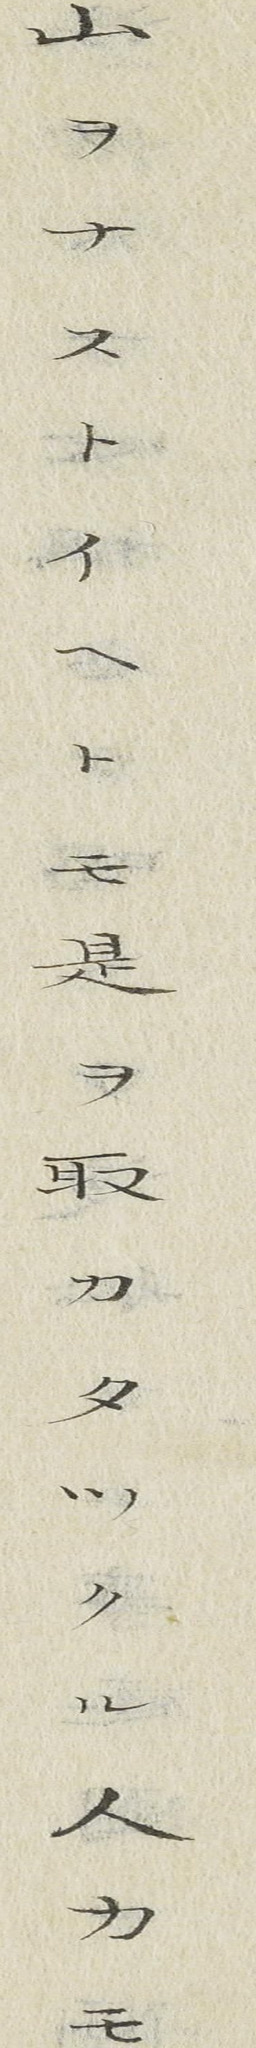山ヲナストイヘトモ是ヲ取カタツクル人力モ
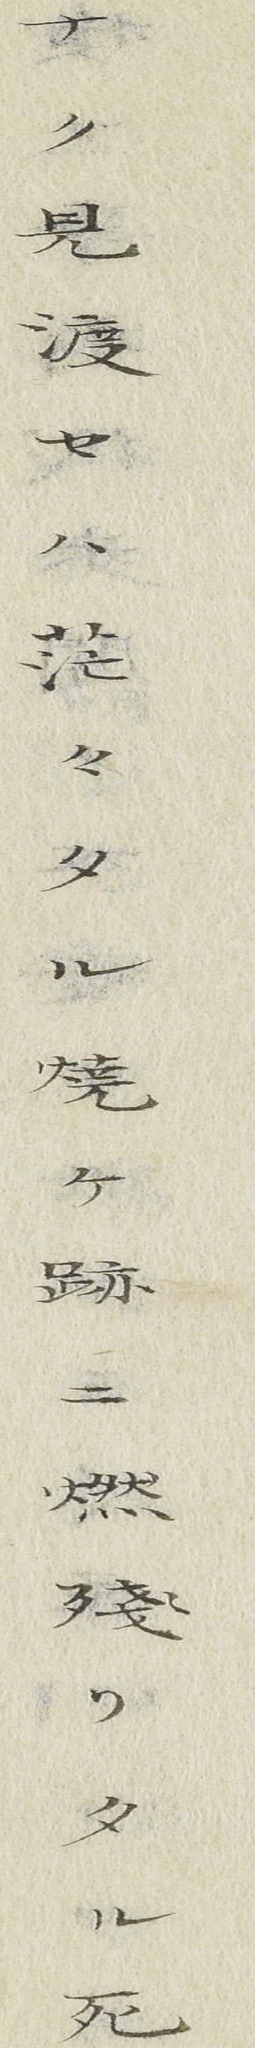ナク見渡セハ茫々タル焼ケ跡ニ燃残リタル死
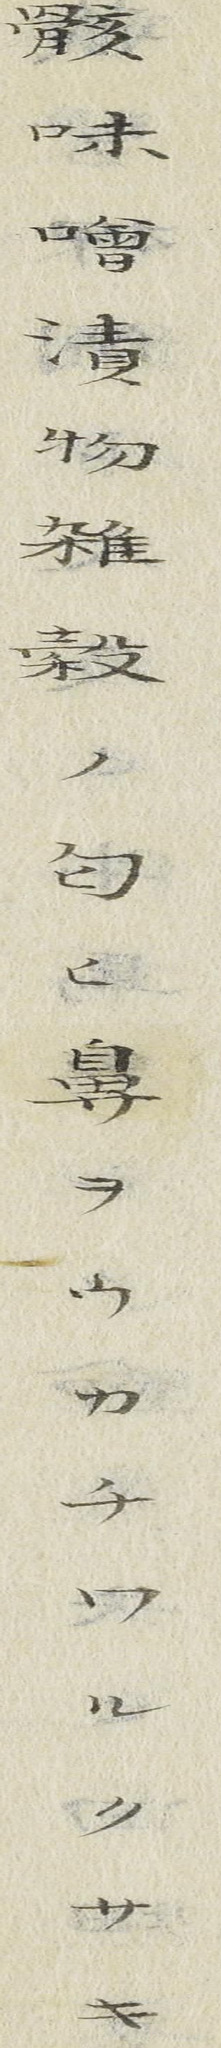骸味噌漬物雑穀ノ匂ヒ鼻ヲウカチワルクサキ
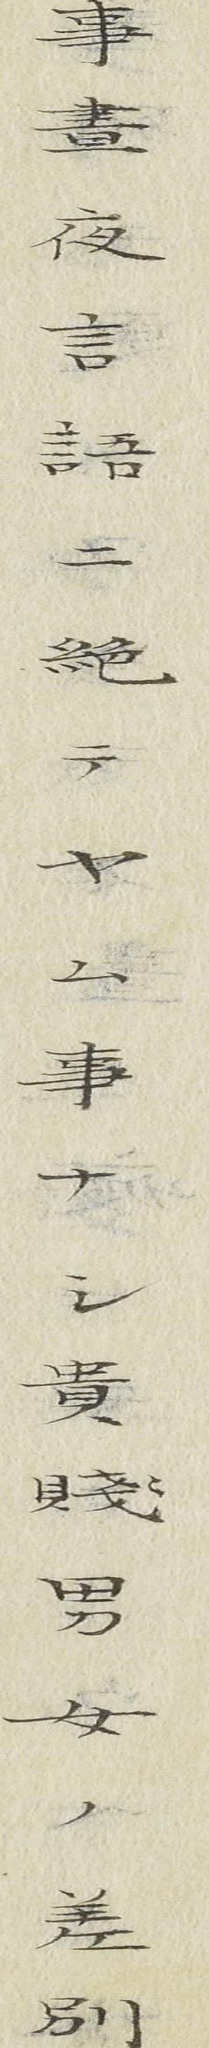事昼夜言語ニ絶テヤム事ナシ貴賤男女ノ差別
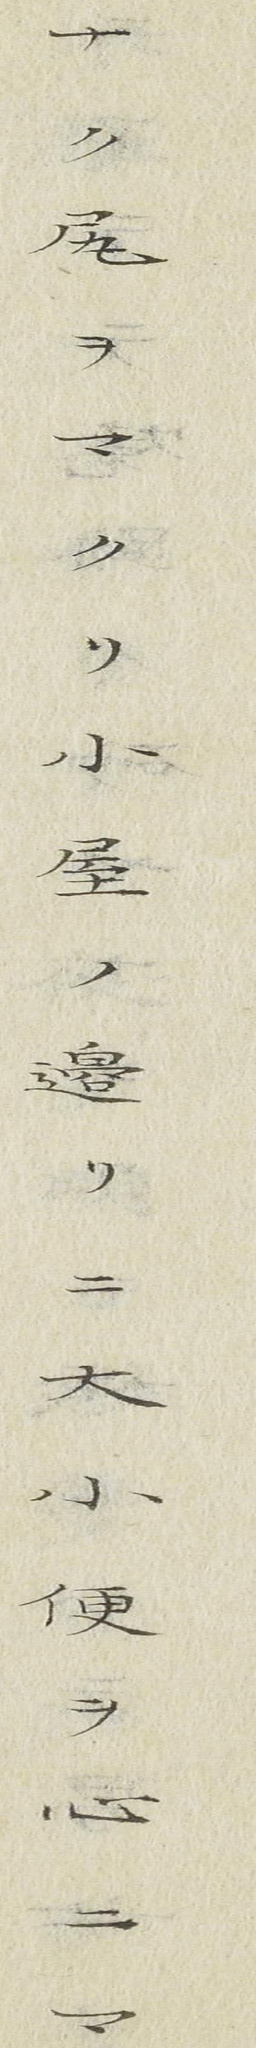ナク尾ヲマクリ小屋ノ辺リニ大小便ヲ心ニマ
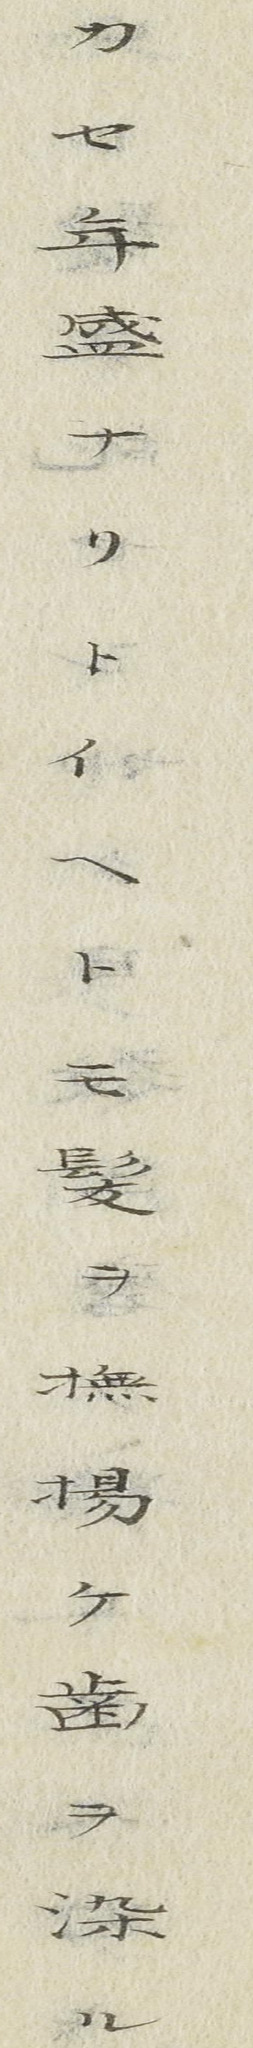カセ年盛ナリトイヘトモ髪ヲ撫揚ケ歯ヲ染ル
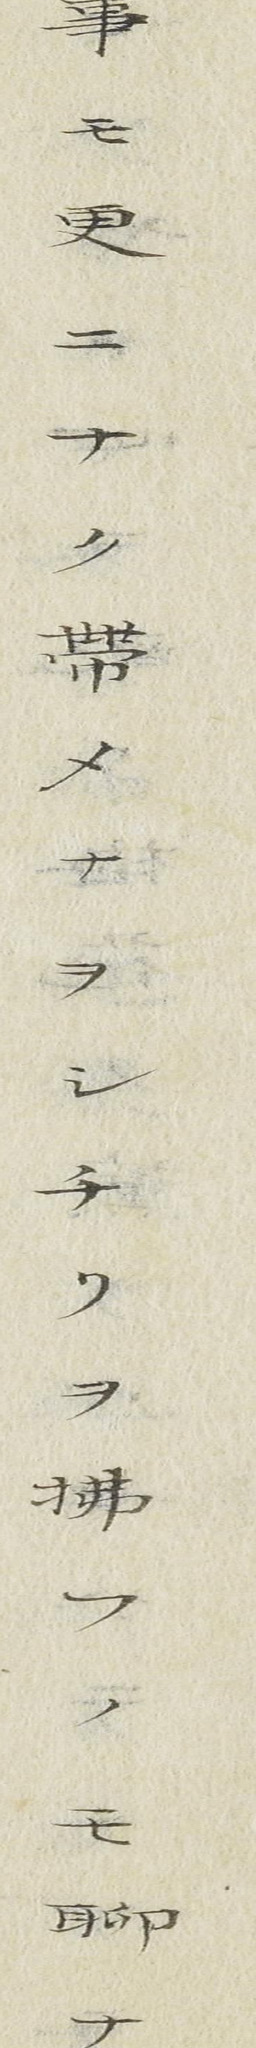事モ更ニナク帯〆ナヲシチリヲ払フノモ聊ナ
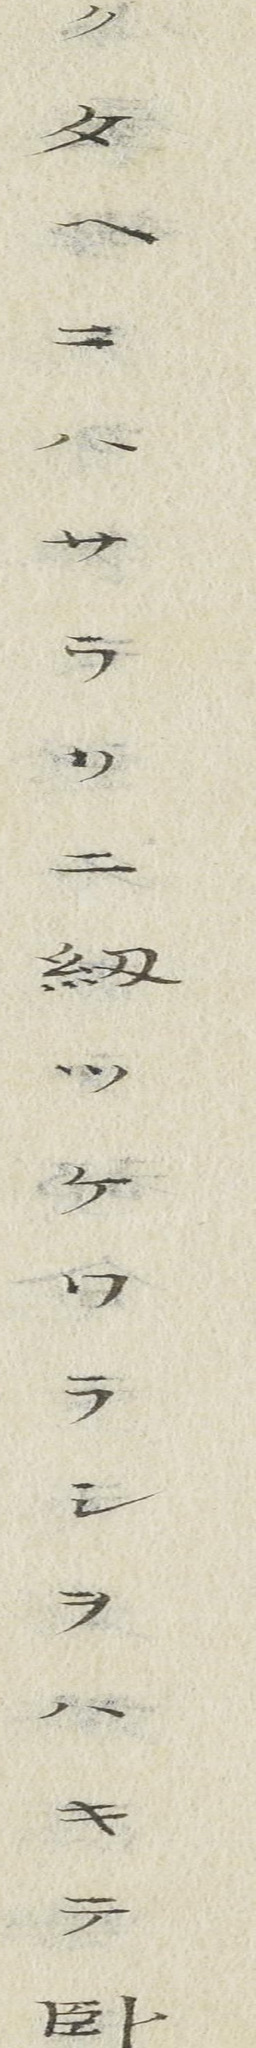クタヘニハサラリニ紐ツケワラシヲハキテ卧
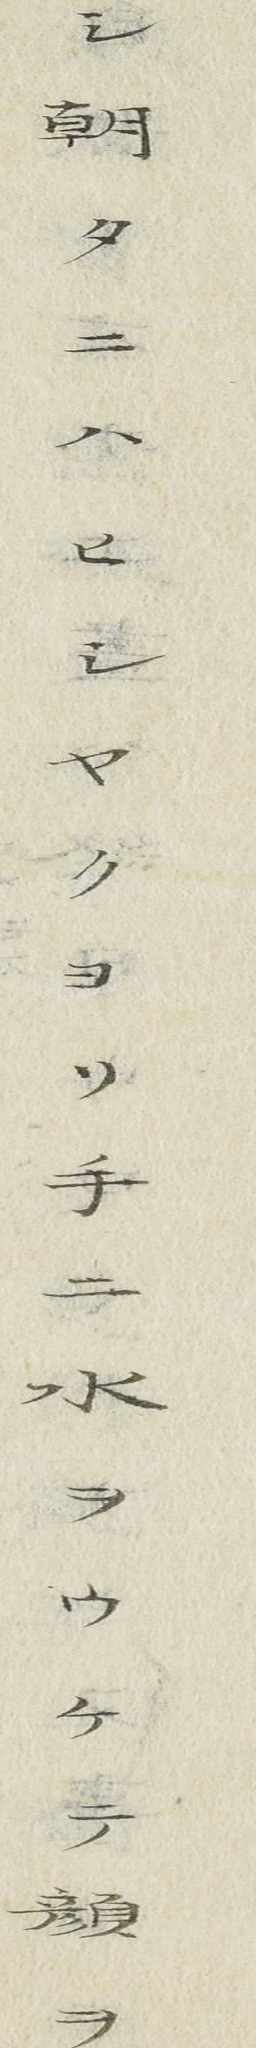シ朝タニハヒシヤクヨリ手ニ水ヲウケテ顔ヲ
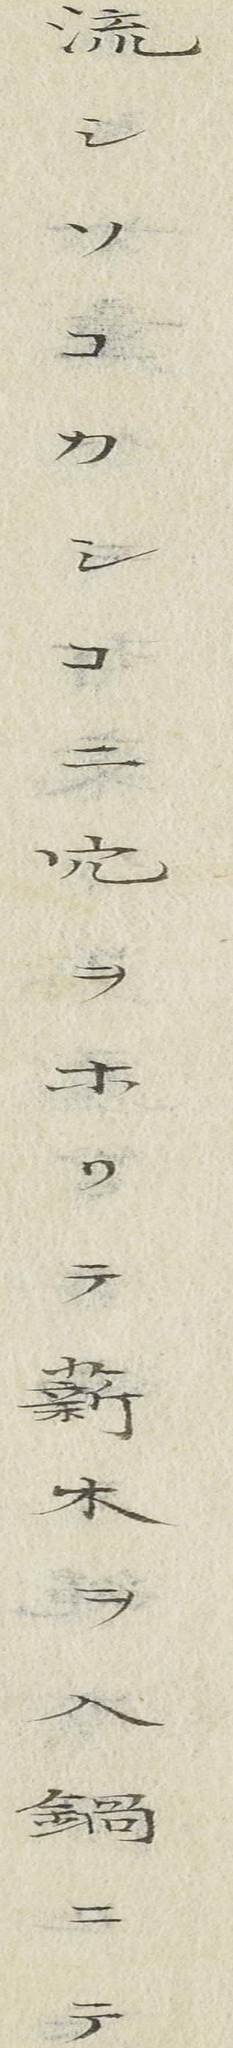流シソコカシコニ穴ヲホリテ薪木ヲ入鍋ニテ
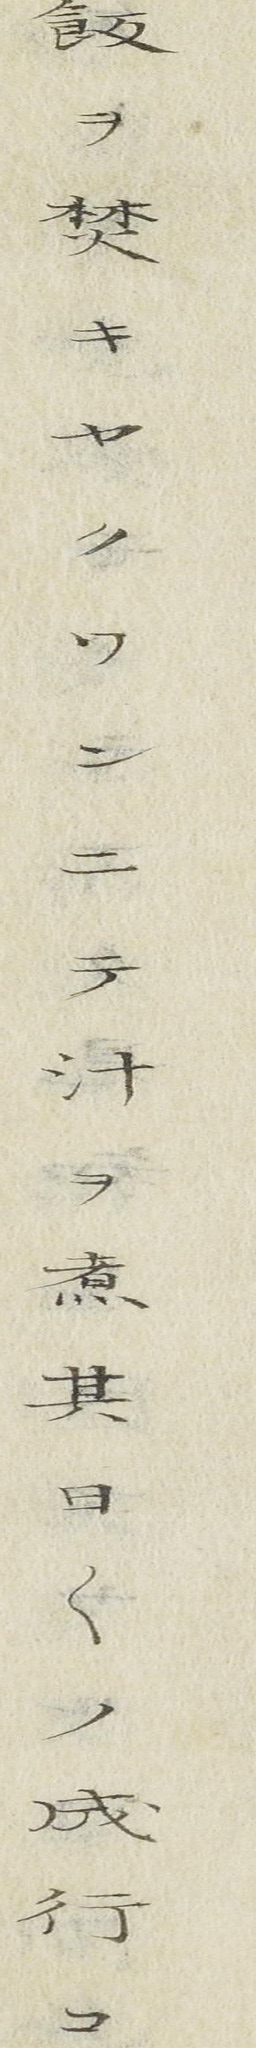飯ヲ焚キヤクワンニテ汁ヲ煮其日〱ノ成行コ
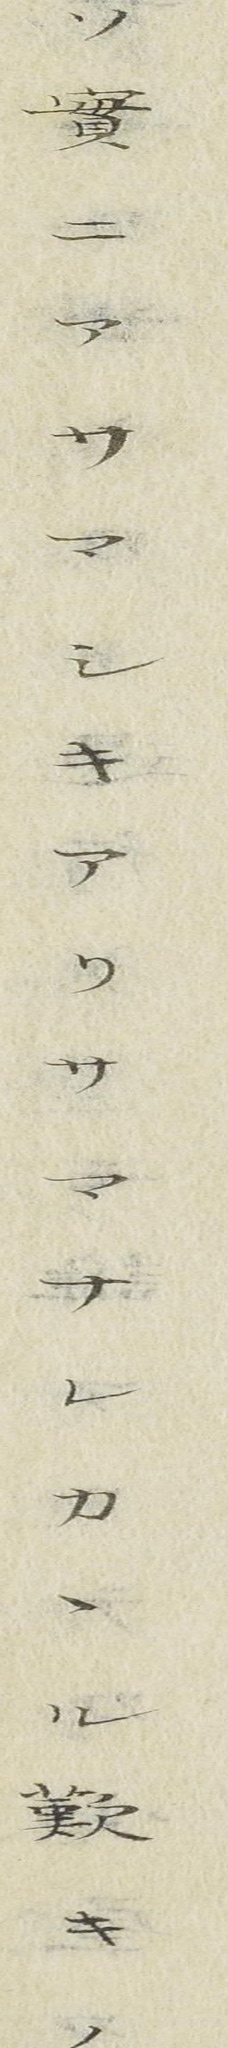ソ実ニアサマシキアリサマナレカヽル歎キノ
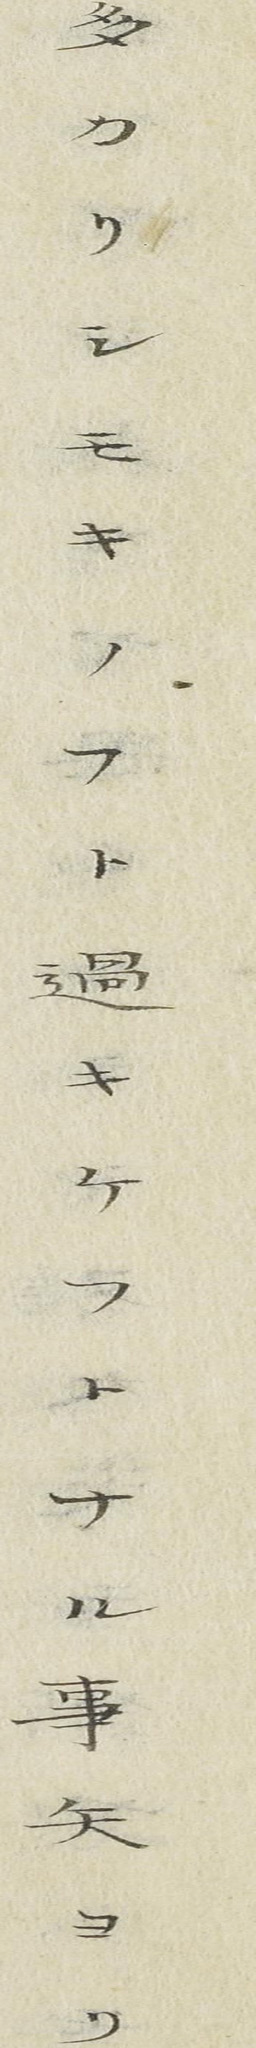多カリシモキノフト過キケフトナル事矢ヨリ
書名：地災撮要　地震之部　巻ノ二
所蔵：東京大学地震研究所図書室 Earthquake Research Institute Library, The University of Tokyo, JAPAN
